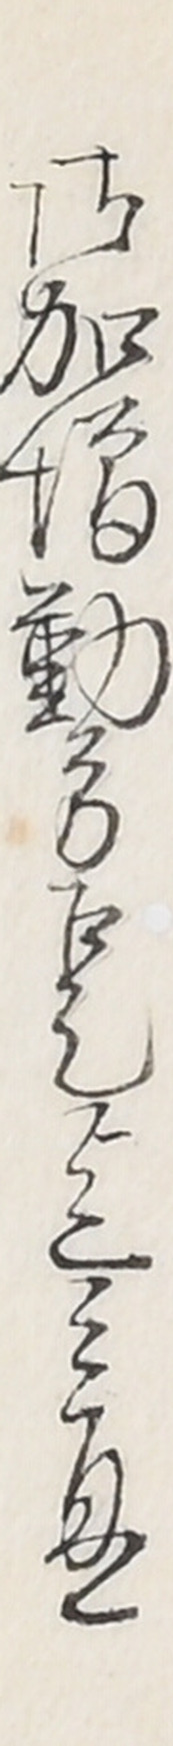御加増勤方是迄之通
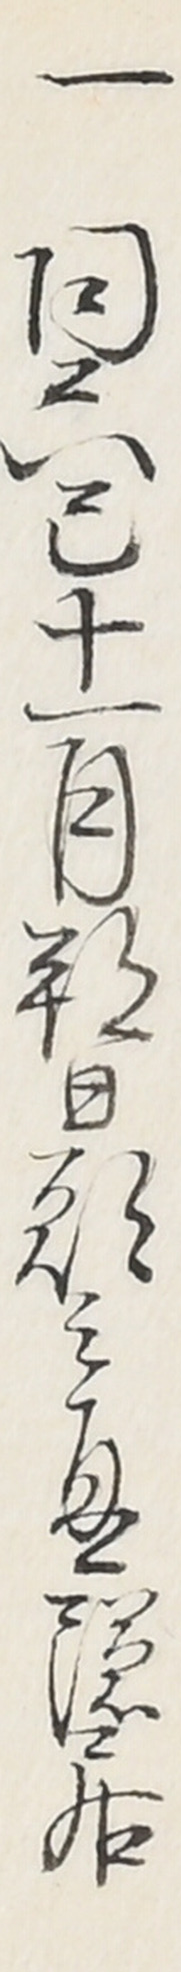一同六巳十一月朔日願之通隠居
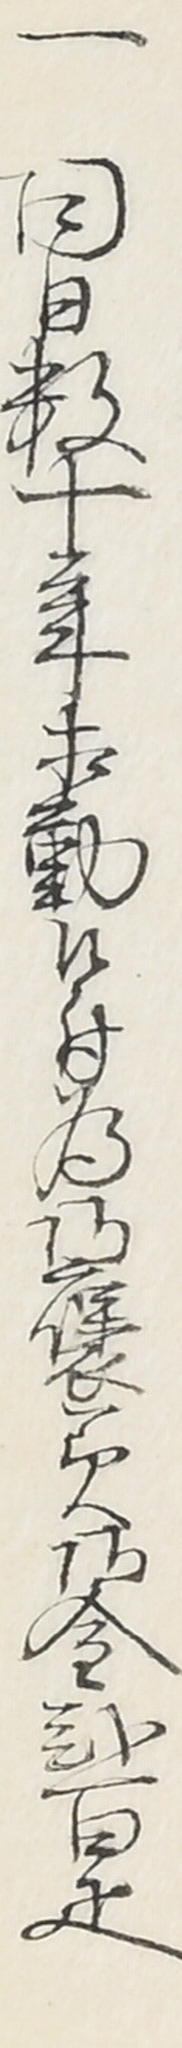一同日数十年相勤候付為御褒美御金弐百疋
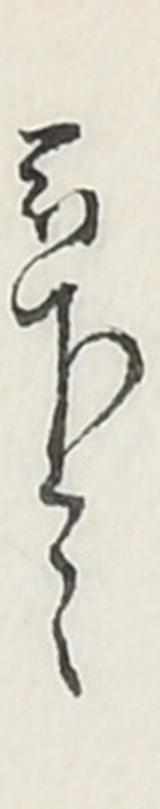被下之
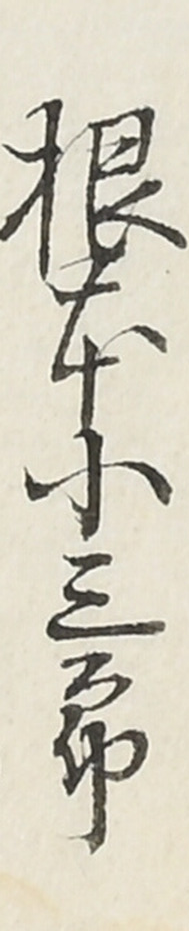根本小三郎
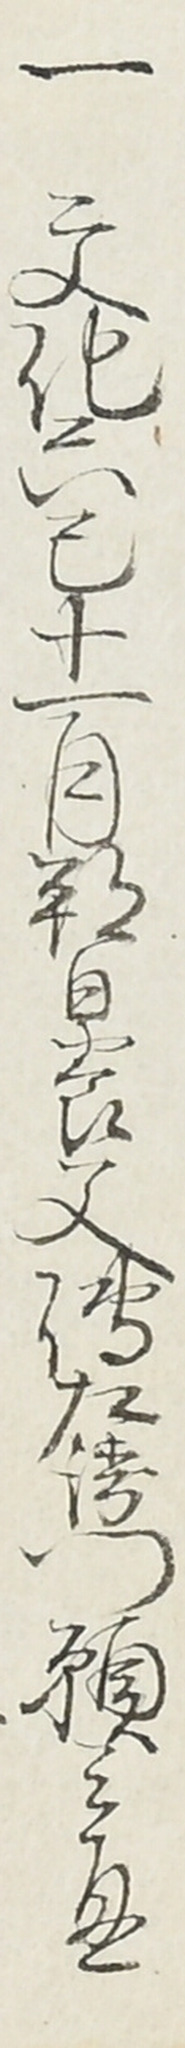一文化六巳十一月朔日養父伝左衛門願之通
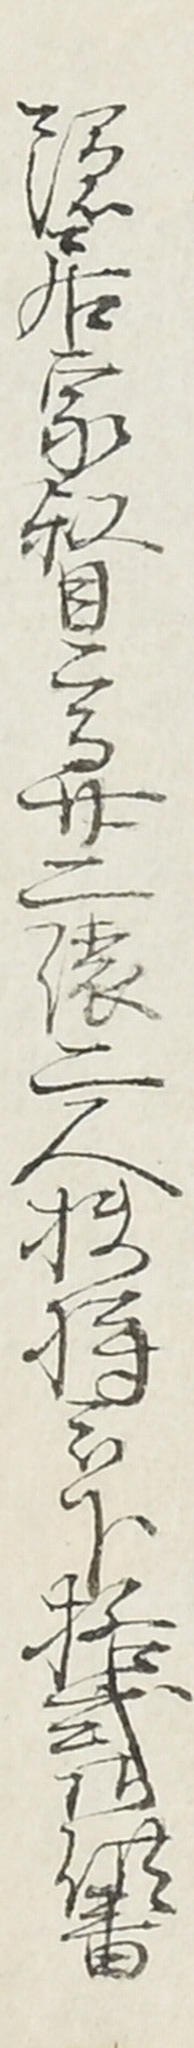隠居家督高廿二俵二人扶持被下格式御供番
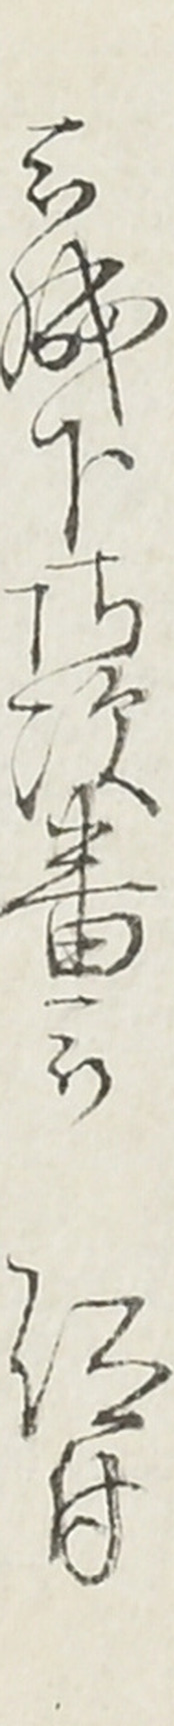被成下御次番被仰付
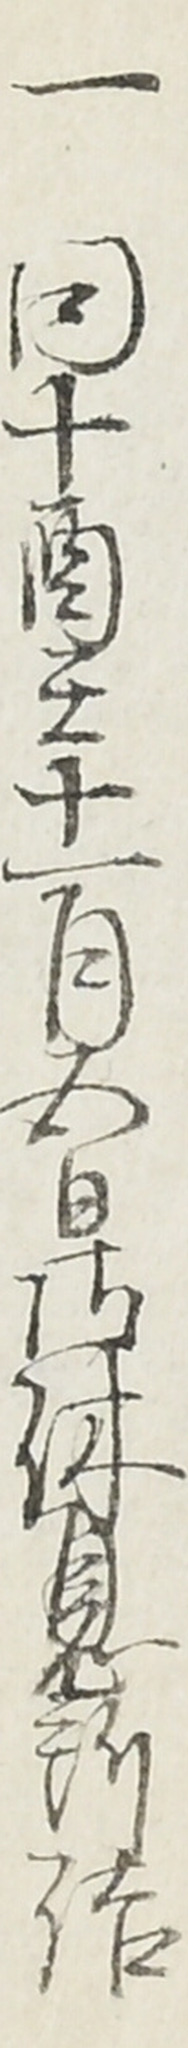一同十酉閏十一月五日御休息所詰
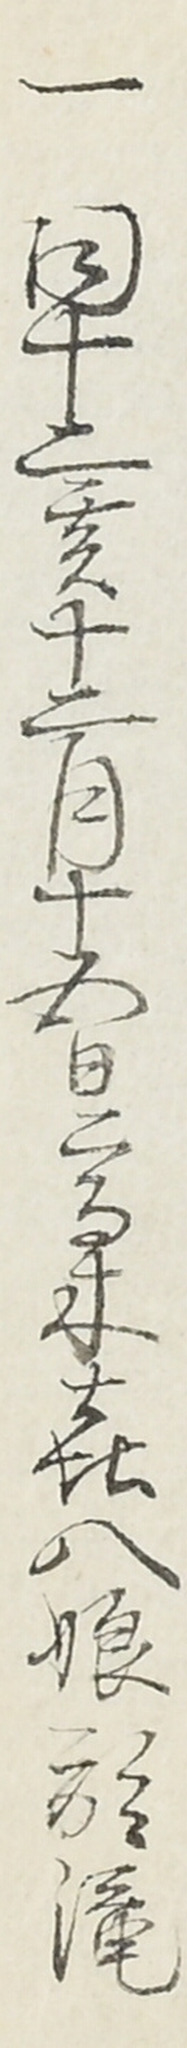一同十二亥十二月十五日高木喜八娘於滝
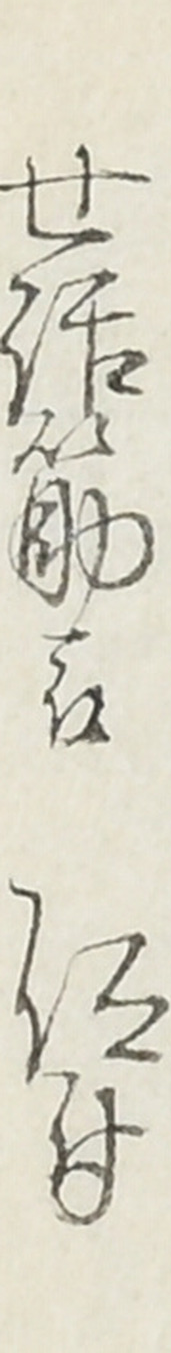世話筋被仰付
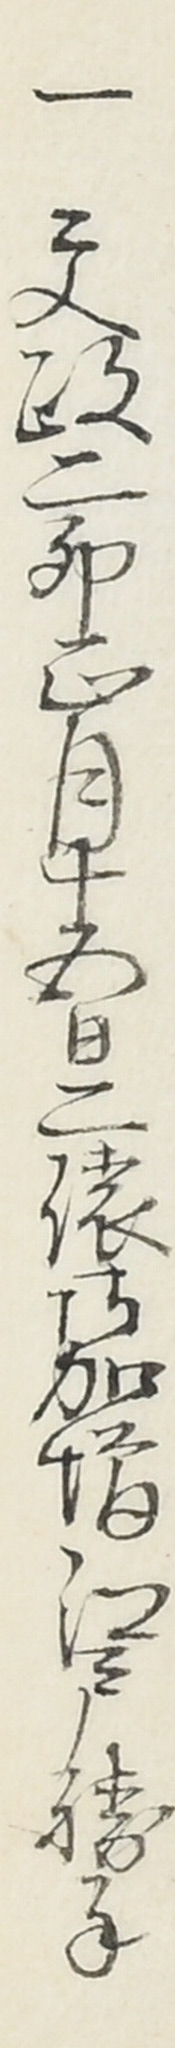一文政二卯正月十五日二俵御加増江戸勝手

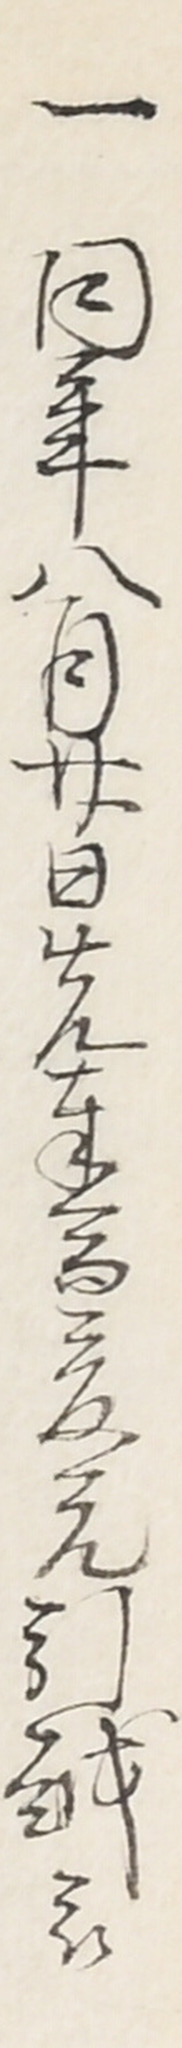一同年八月廿日先達而爰元引越被
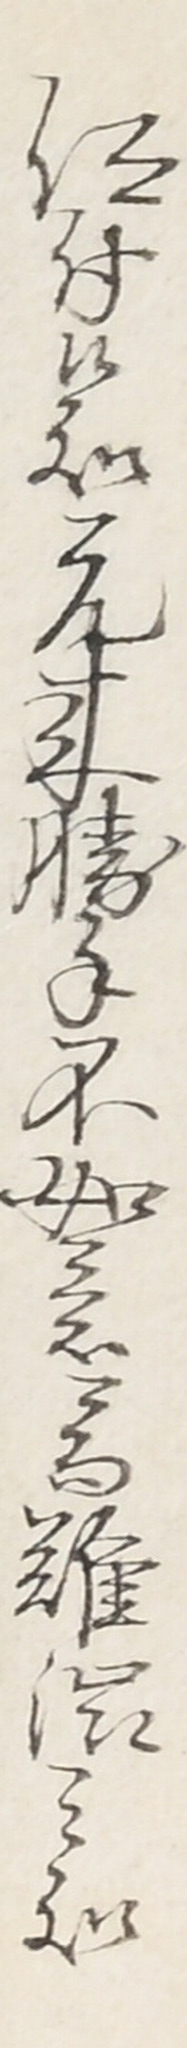仰付候処元来勝手不如意ニ而難渋之処
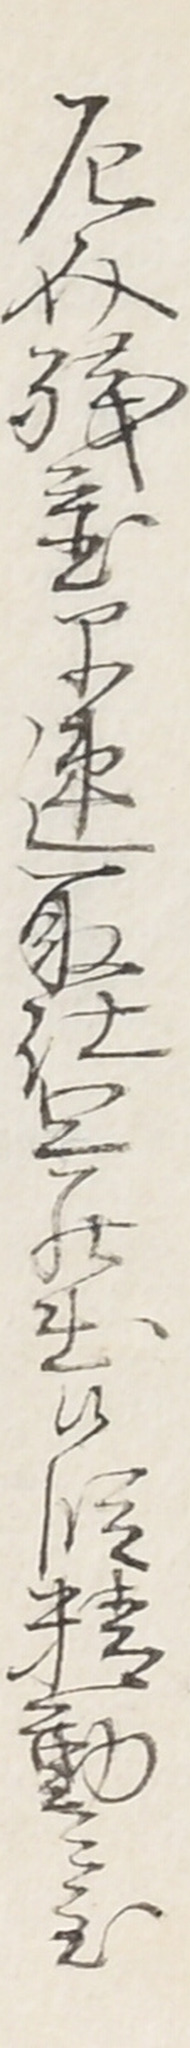厄介残置早速取仕廻罷出候段精勤之至
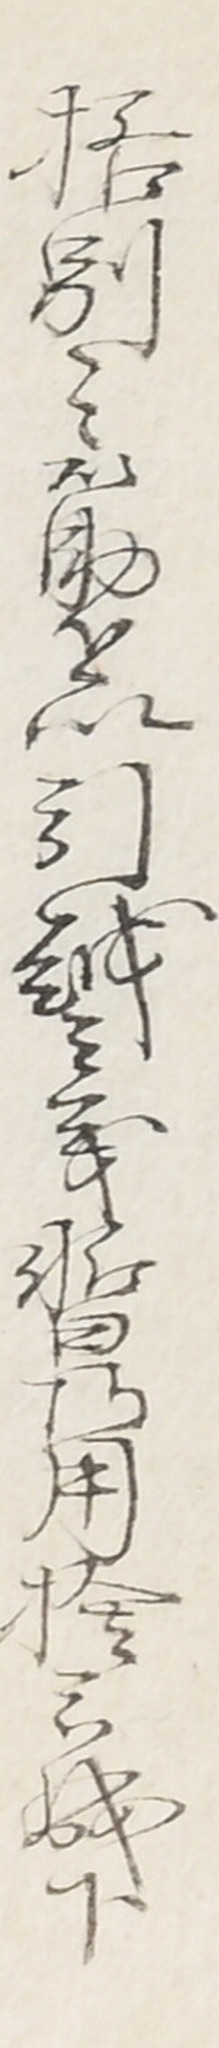格別之筋を以引越之義暫御用捨被成下
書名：無足諸士勤仕録（四）
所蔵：伊那市立高遠町図書館・合同会社AMANE
